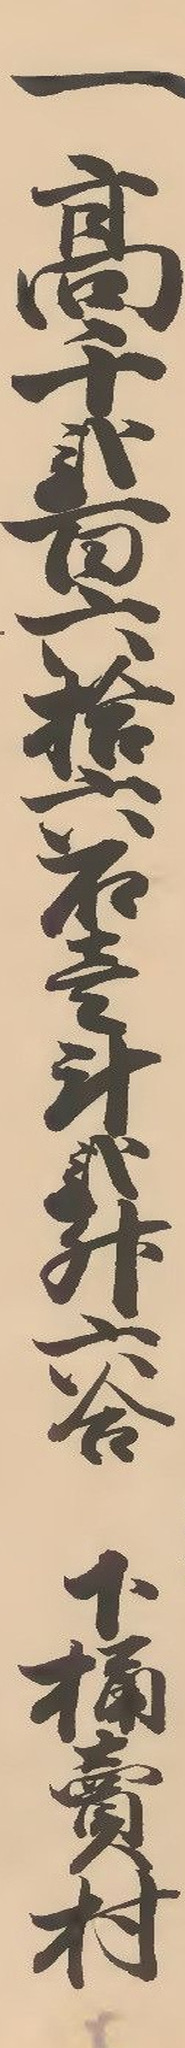一高千弐百六拾六石壱斗弐升六合下桶売村
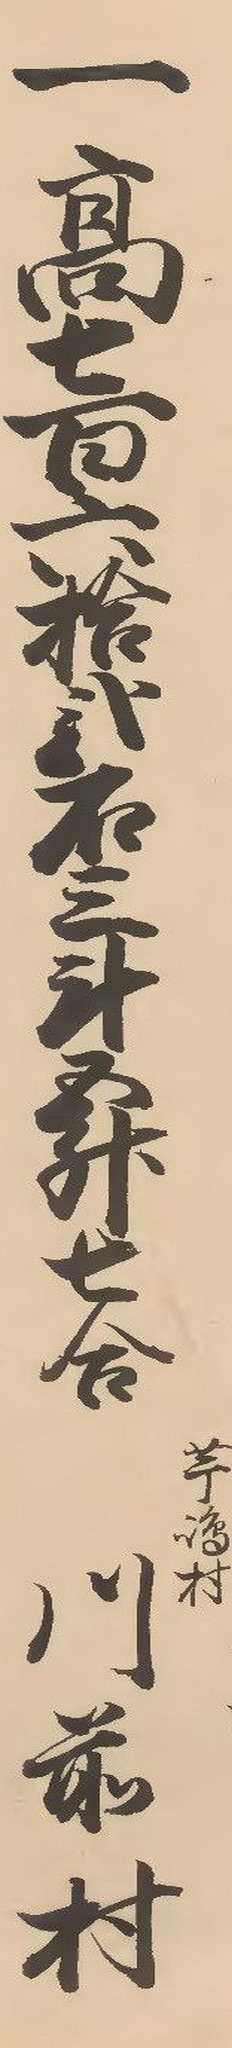一高七百六拾弐石三斗五升七合川前村
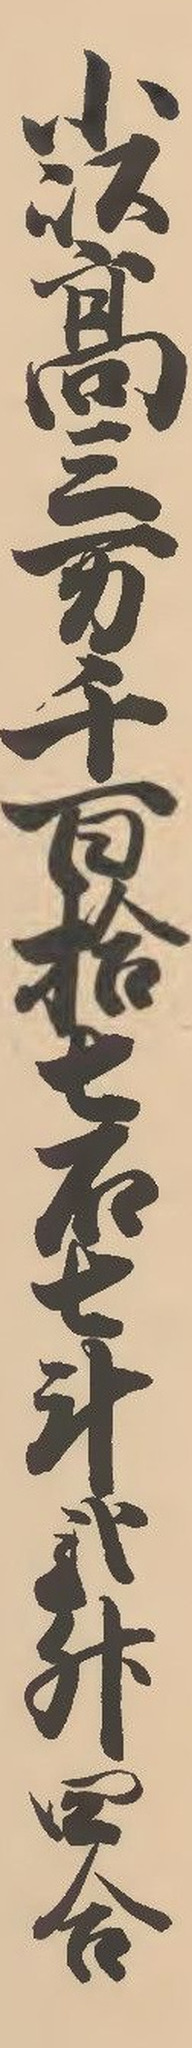小以高三万千百拾七石七斗弐升四合

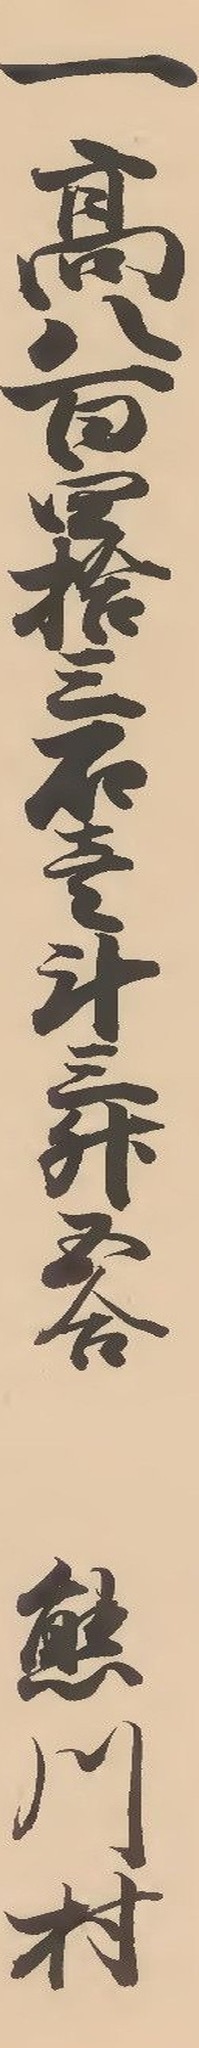一高八百四拾三石壱斗三升五合熊川村
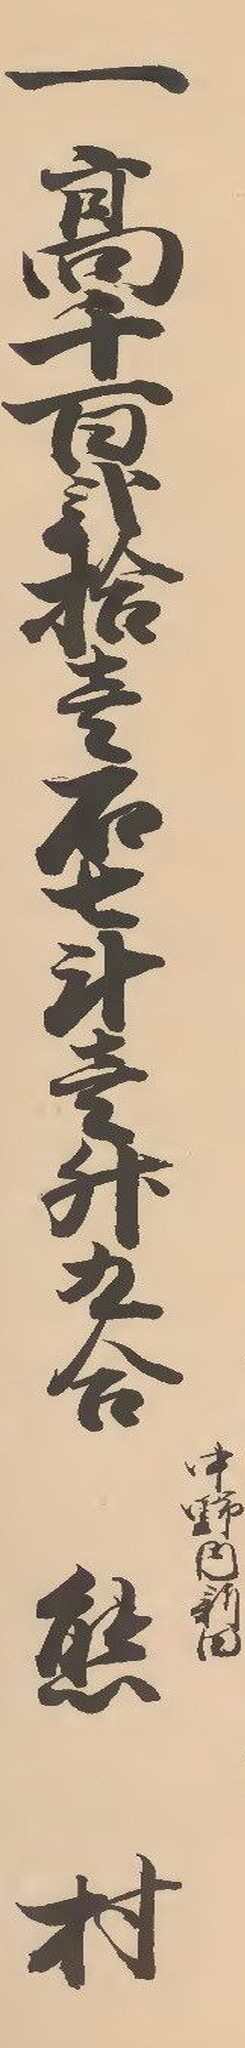一高千百弐拾壱石七斗壱升九合熊村
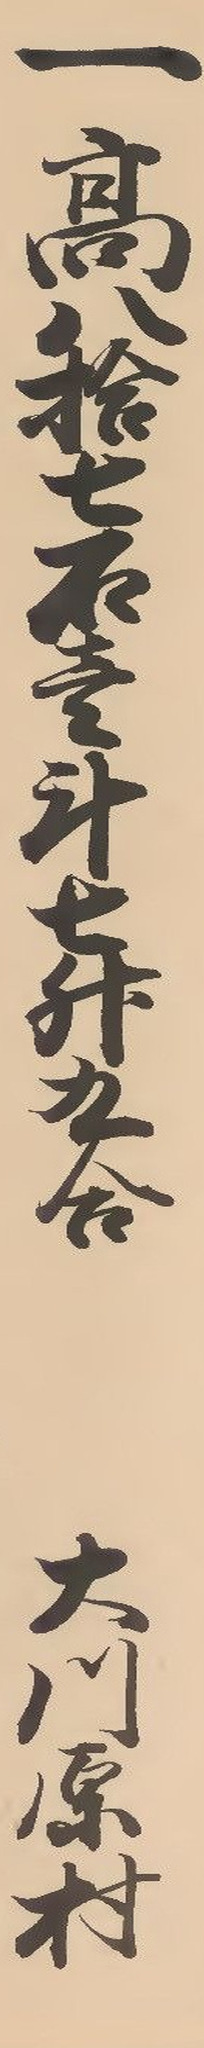一高八拾七石壱斗七升九合大川原村
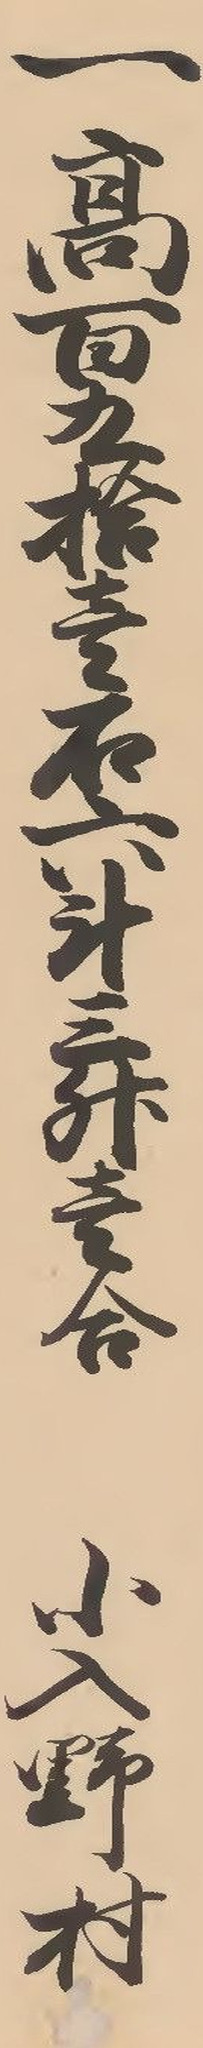一高百九拾壱石六斗三升壱合小入野村
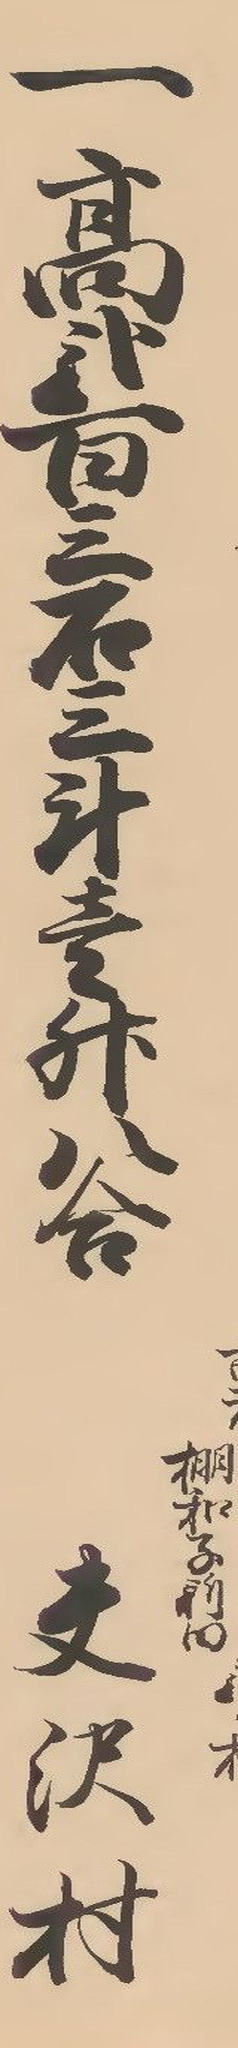一高弐百三石三斗壱升八合夫沢村

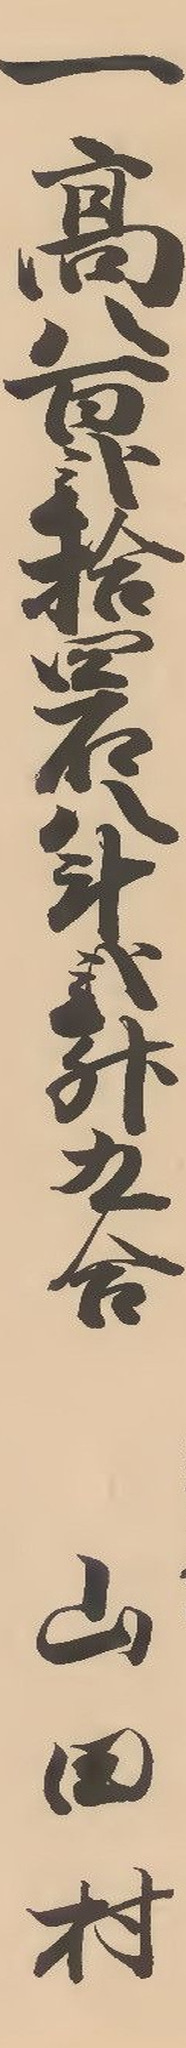一高八百弐拾四石八斗弐升九合山田村
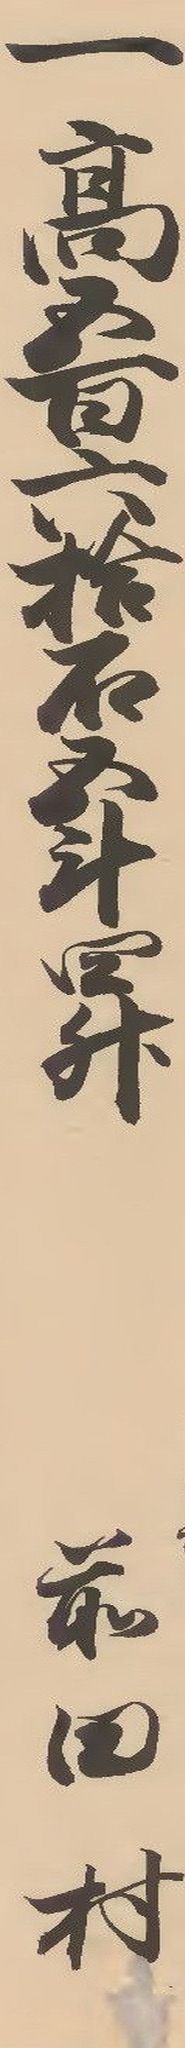一高五百六拾石五斗四升前田村
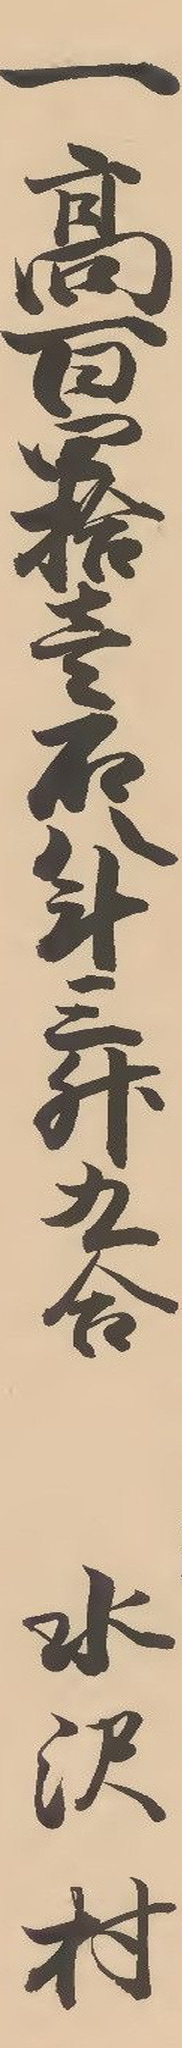一高百四拾壱石八斗三升九合水沢村
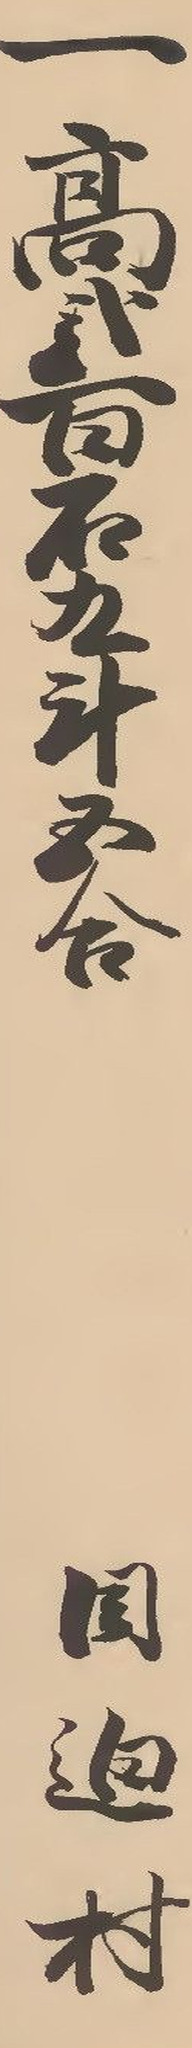一高弐百石九斗五合目迫村
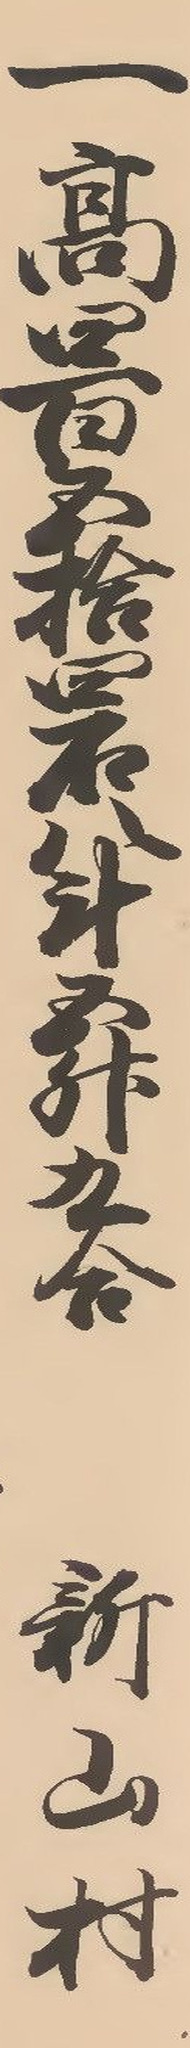一高四百五拾四石八斗五升九合新山村
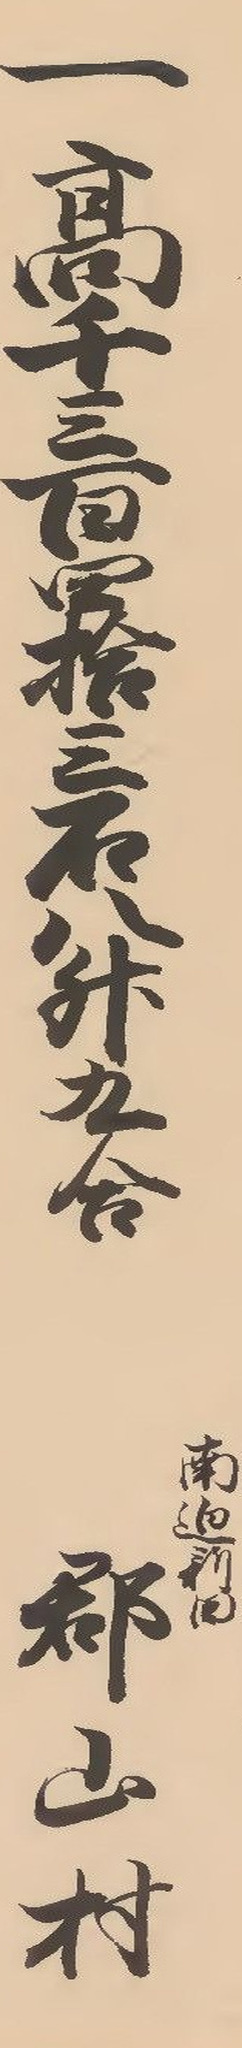一高千三百四拾三石八升九合郡山村
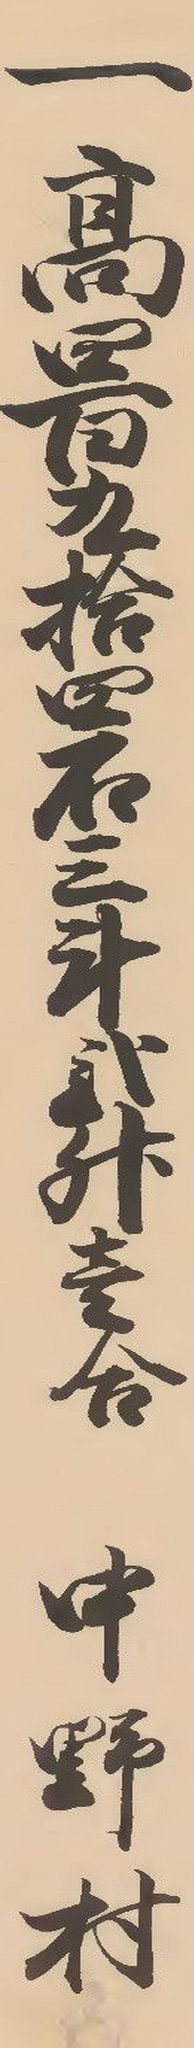一高四百九拾四石三斗弐升壱合中野村
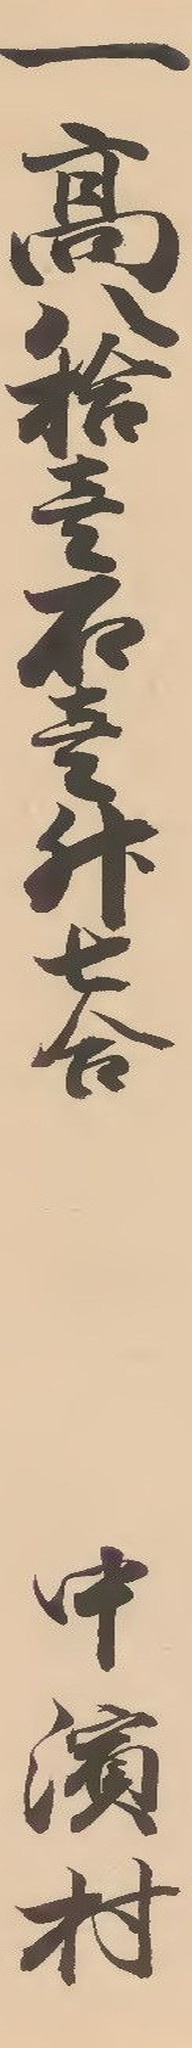一高八拾壱石壱升七合中浜村
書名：陸奥国郷帳　３
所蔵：国立公文書館 National Archives of Japan
